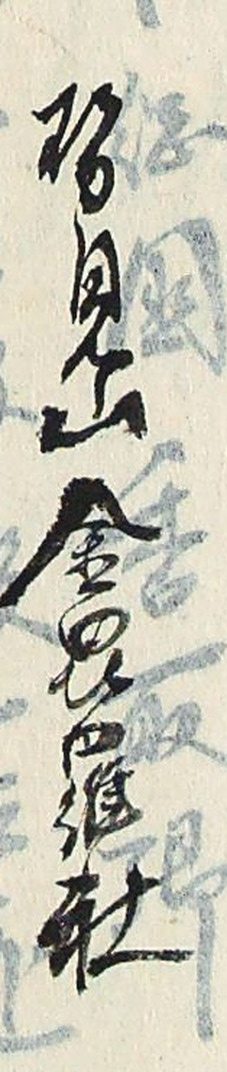勢見山金毘羅社
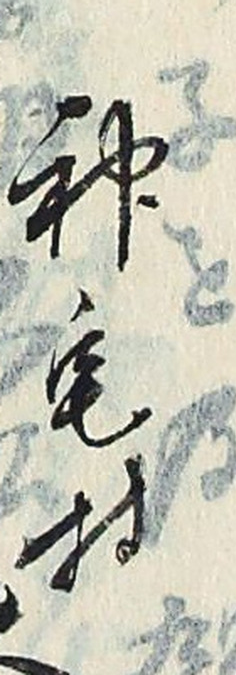神宅村
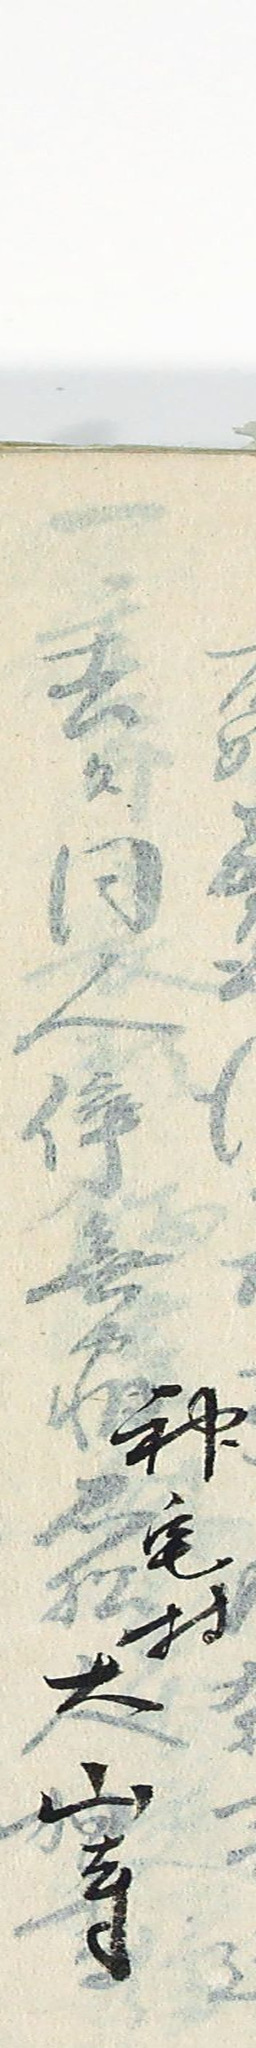大山寺
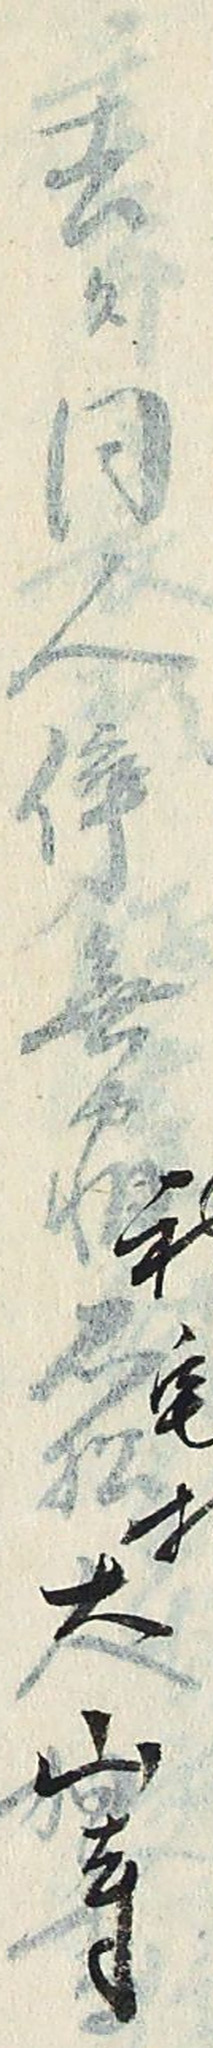大山寺
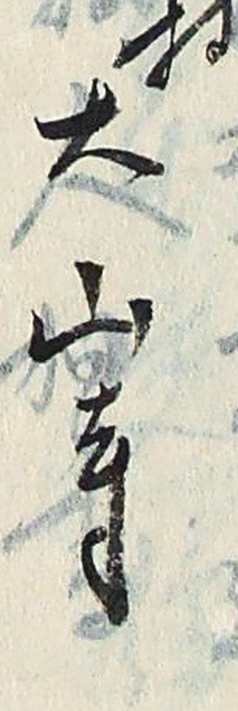大山寺
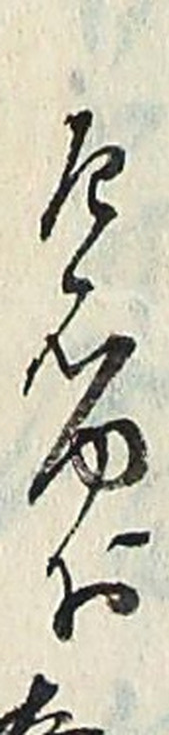左右内村
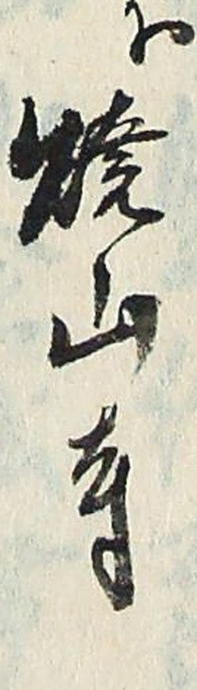焼山寺
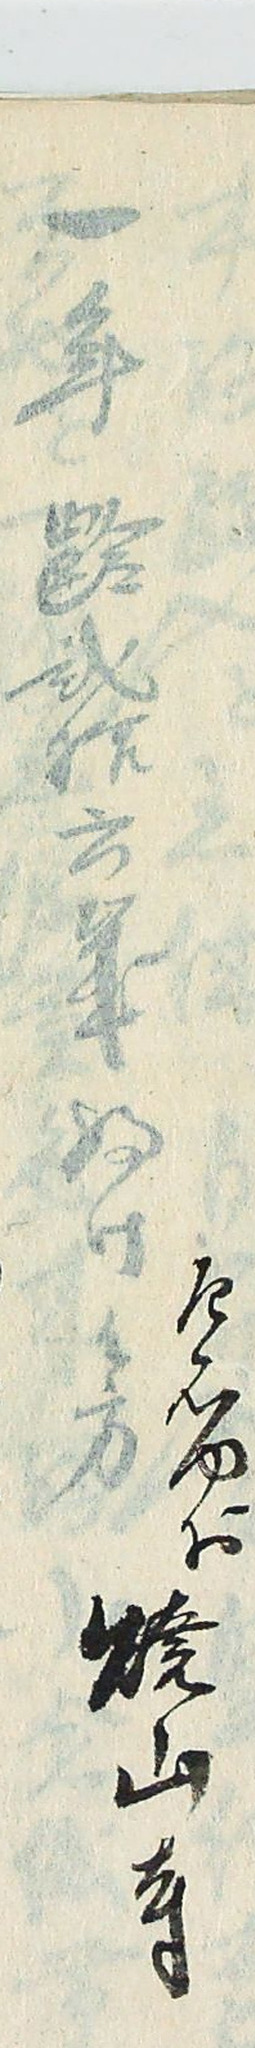焼山寺
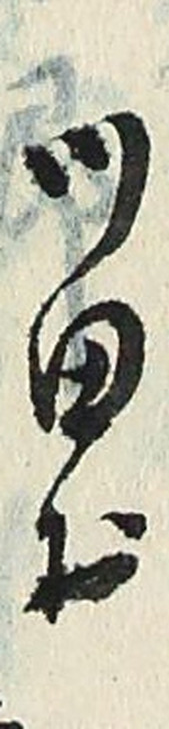川田村
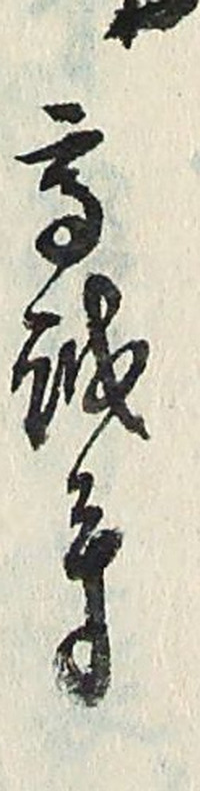高越寺
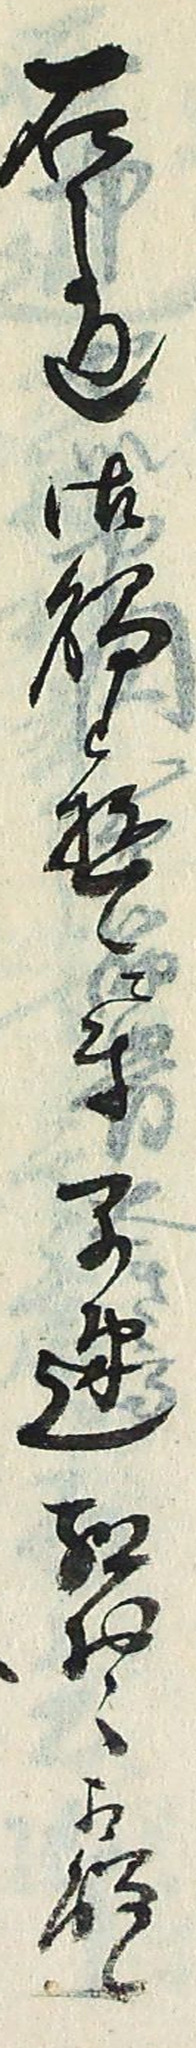右之通御触被遊候に付早速組村々相触候
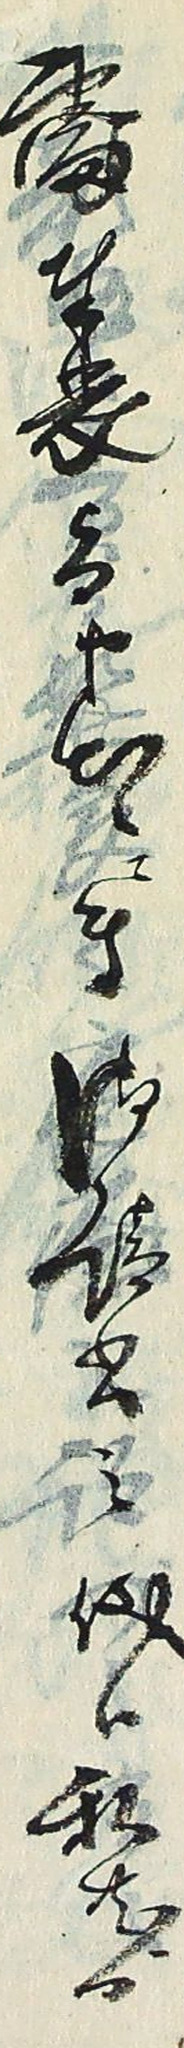処奉畏旨申出候に付御請書之儀は私共ゟ
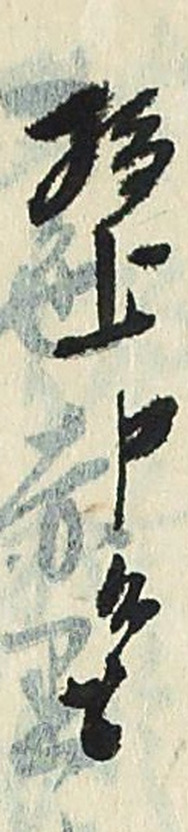指上申候以上
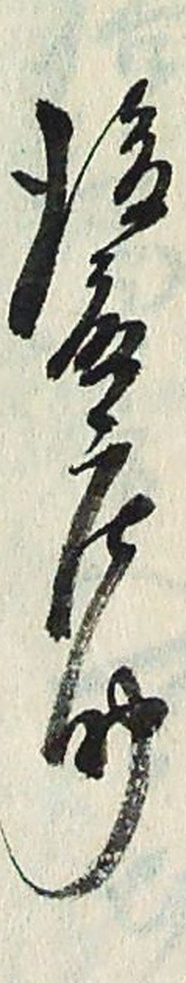後藤庄助
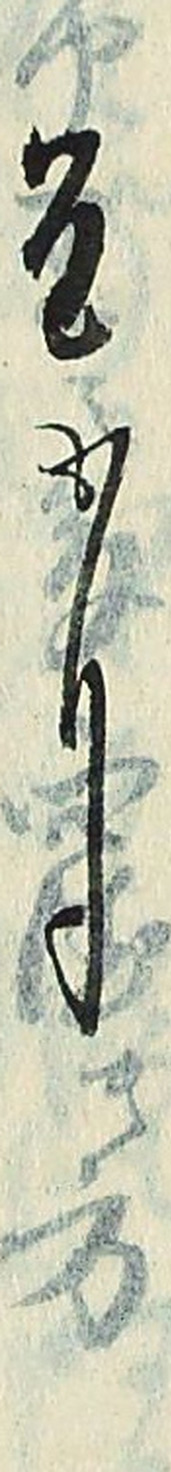閏五月
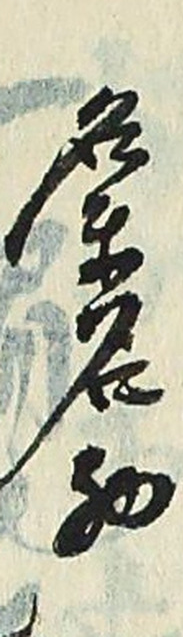名東名西
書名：諸御用御□受書控
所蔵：鳴門教育大学 Naruto University of Education
